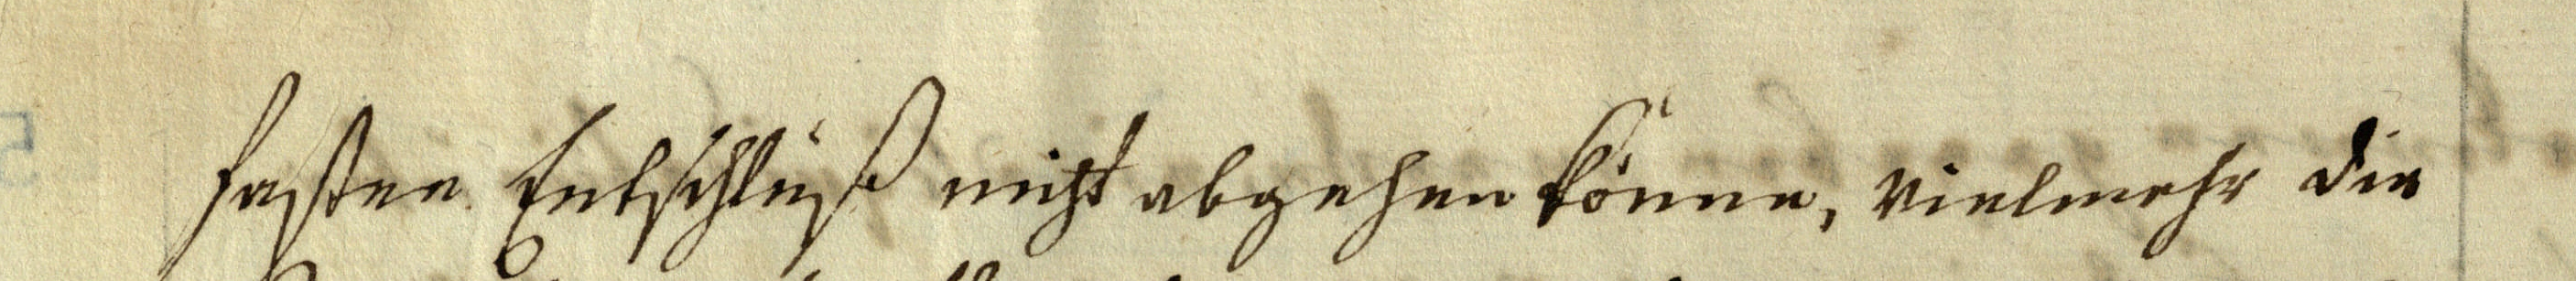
fasten Entschluß nicht abgehen könne, vielmehr die
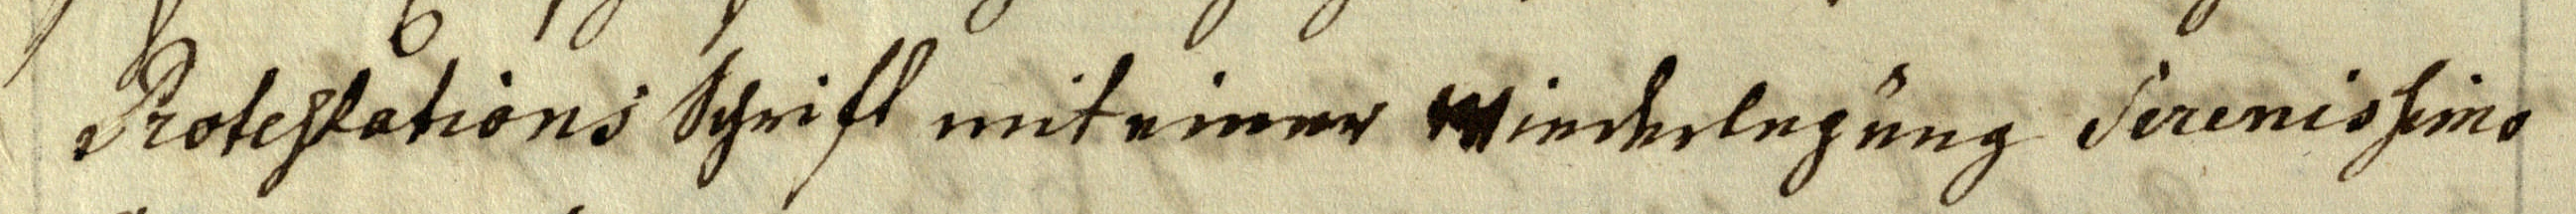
Protestations Schrift mit einer Wiederlegung Serenissimo
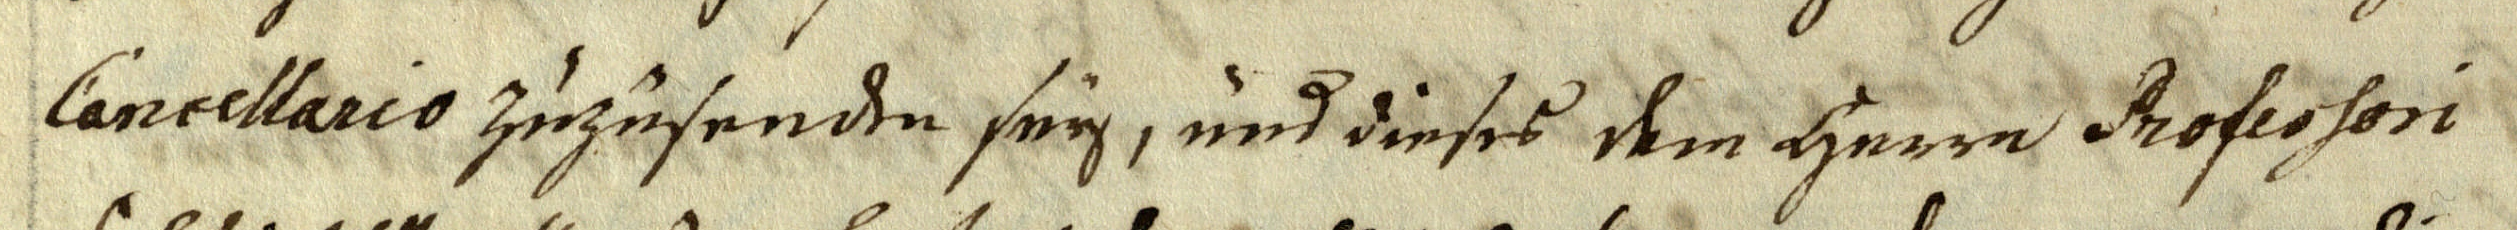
Cancellario zuzusenden seÿ, und dieses dem Herrn Professori
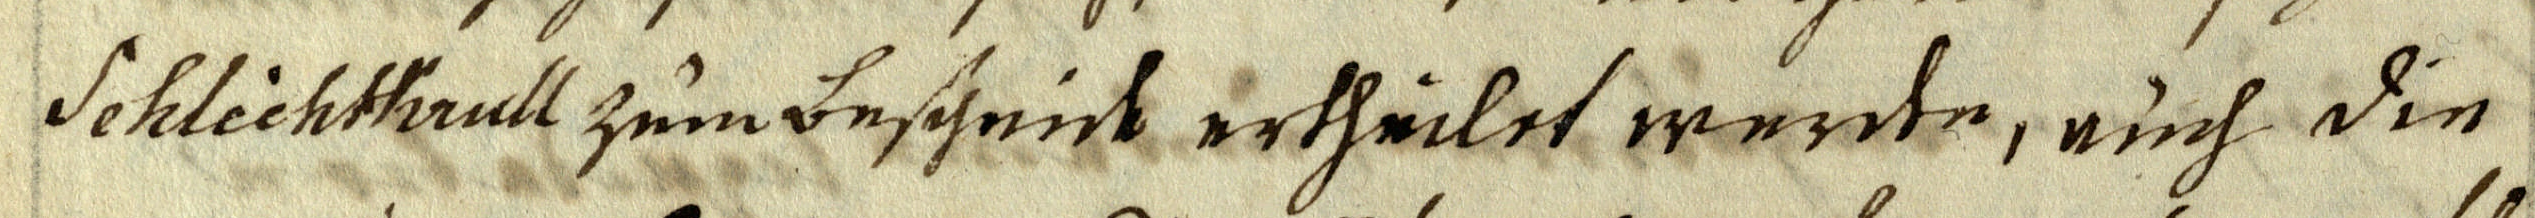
Schlichtkrull zum Bescheide ertheilet werde, auch die
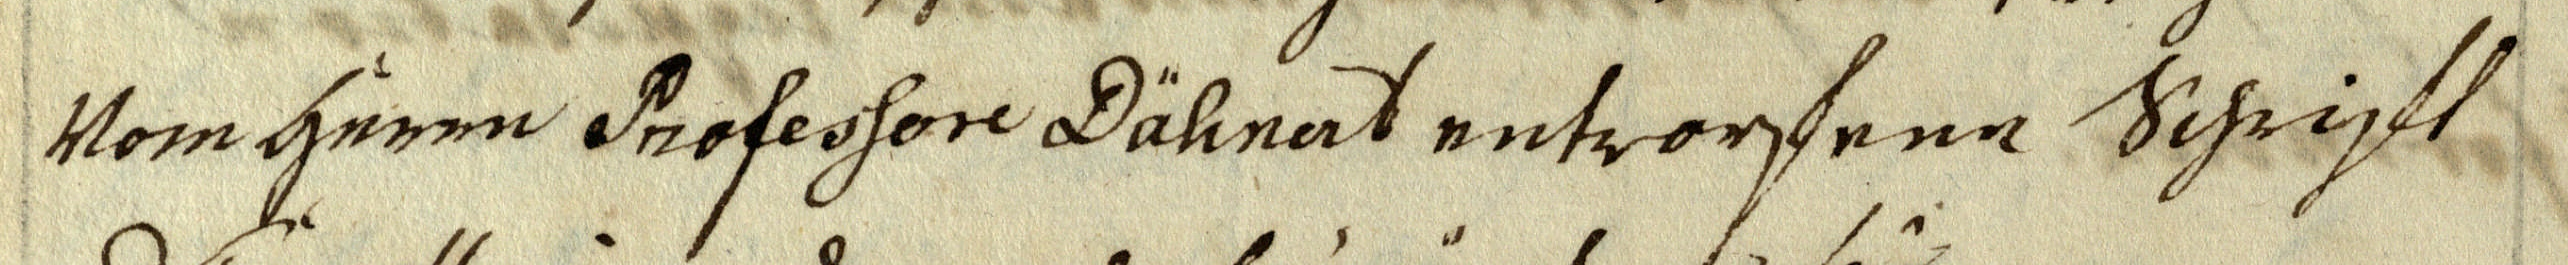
vom Herrn Professore Dähnert entworfene Schrift
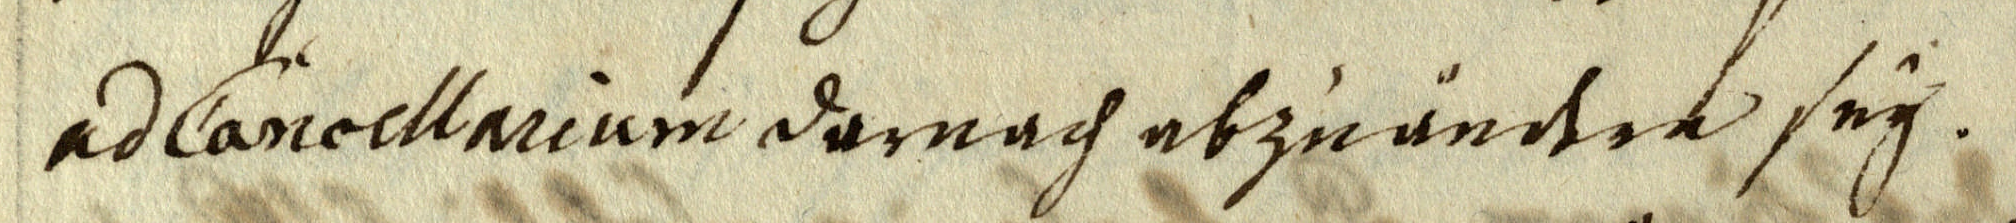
ad Cancellarium darnach abzuändern seÿ.
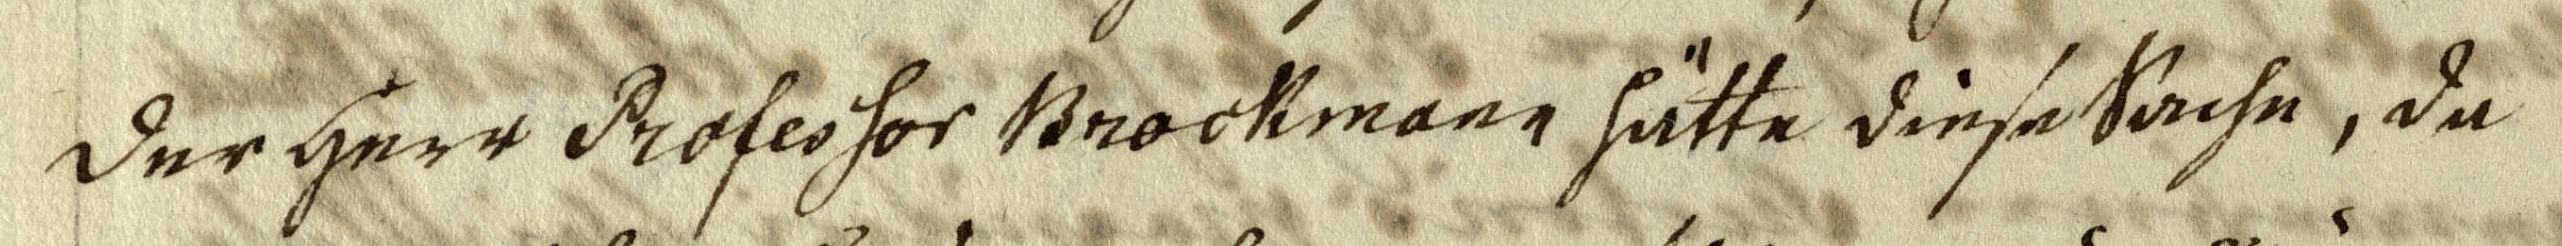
Der Herr Professor Brockmann hätte diese Sache, da
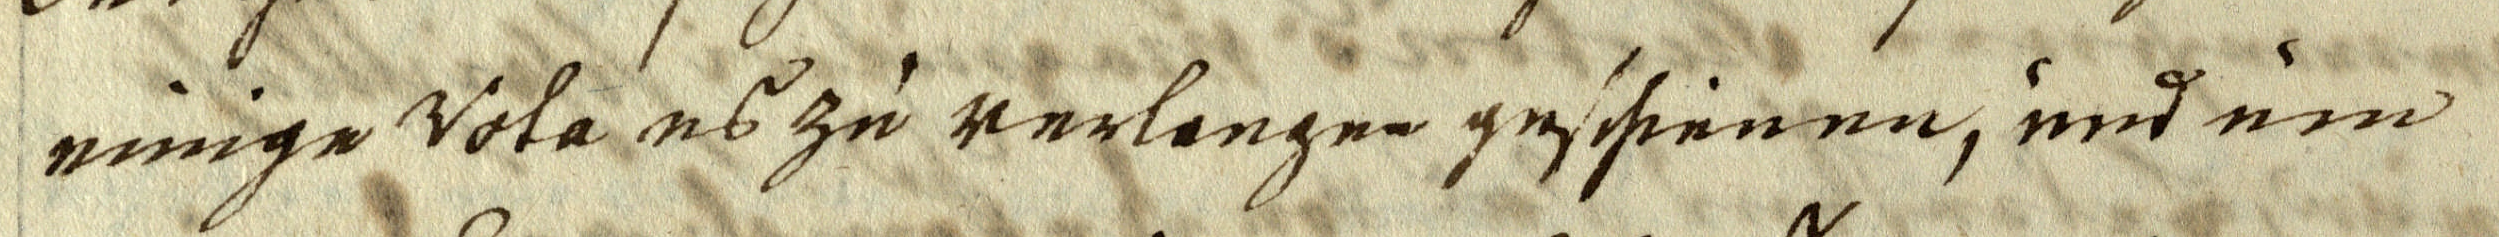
einige Vota es zu verlangen geschienen, und um
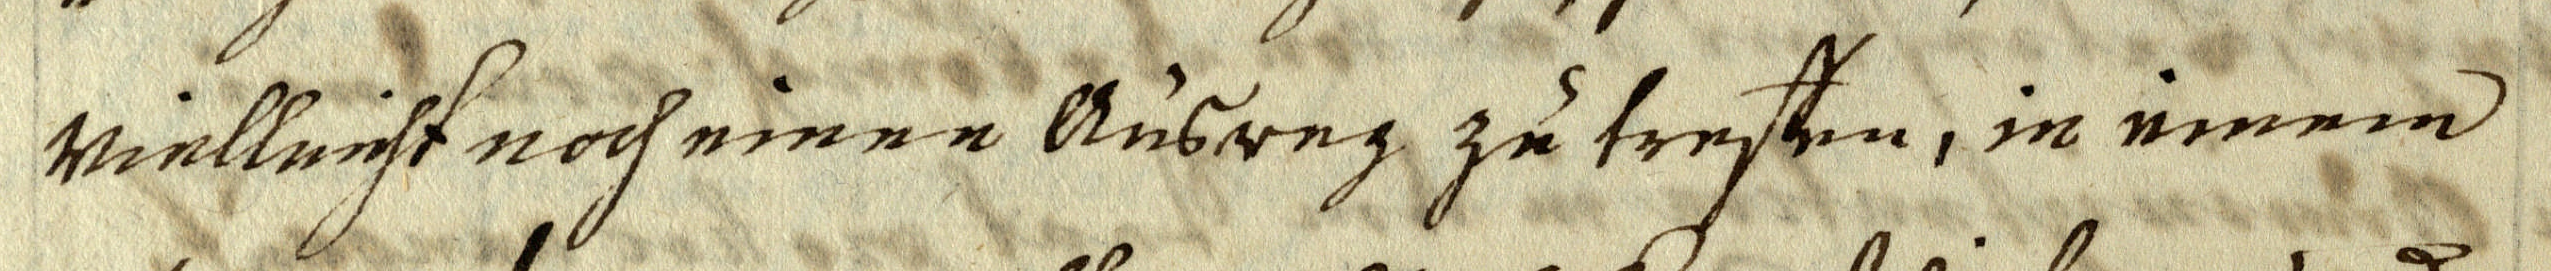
vielleicht noch einen Ausweg zu treffen, in einem
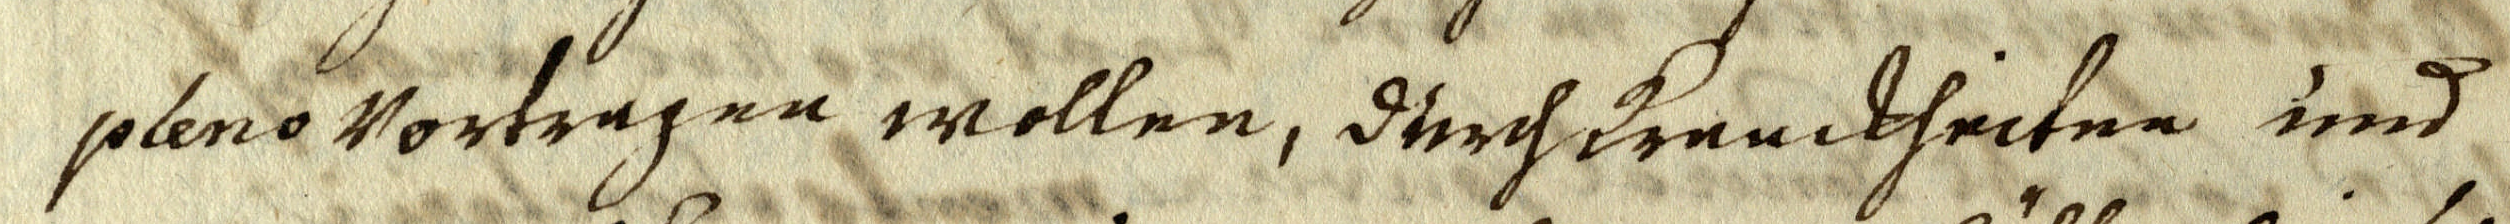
pleno vortragen wollen, durch Kranckheiten und
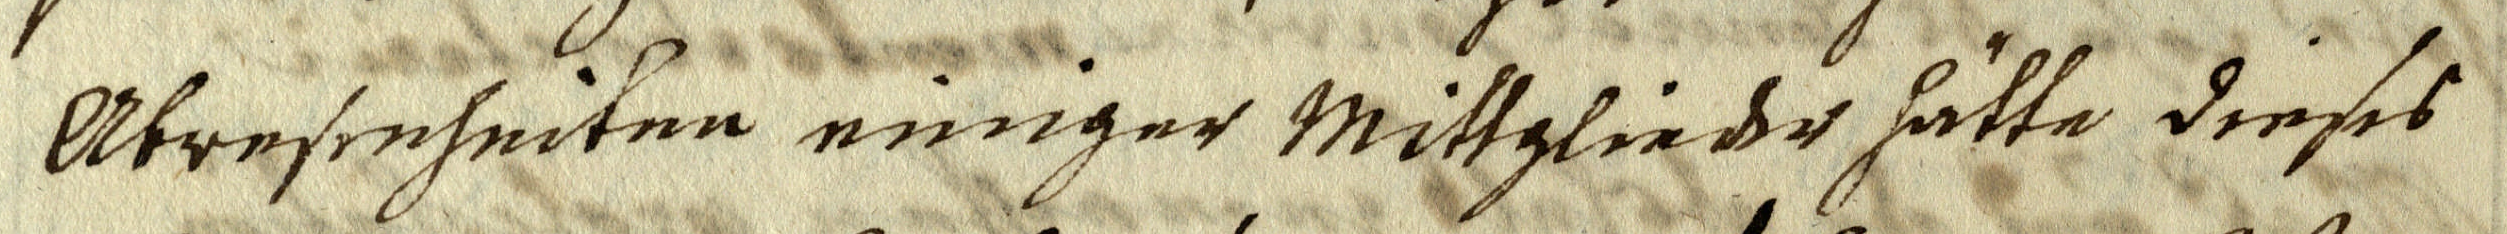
Abwesenheiten einiger Mittglieder hätte dieses
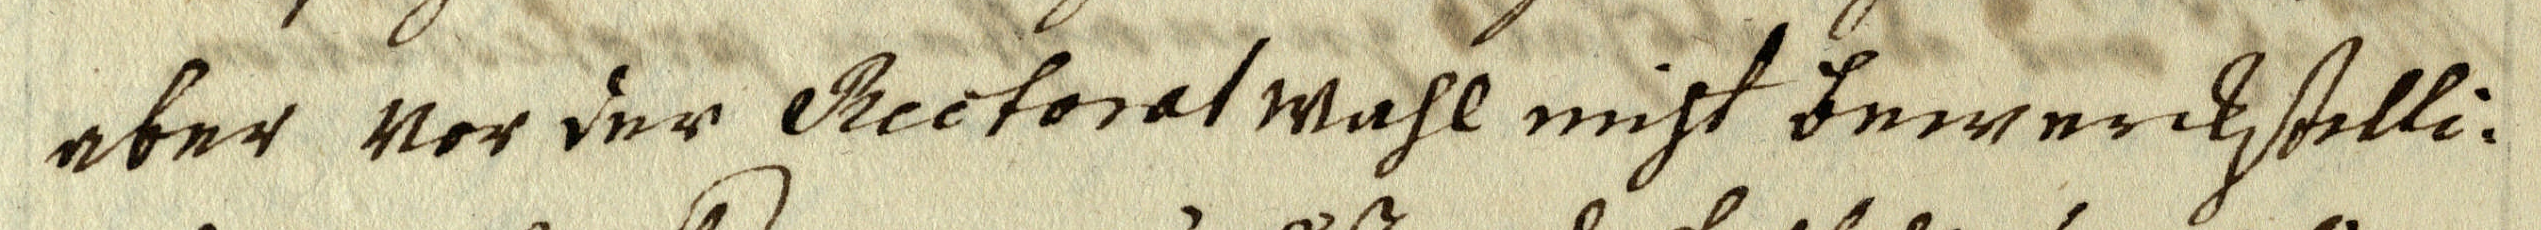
aber vor der Rectoratwahl nicht bewerckstelli¬
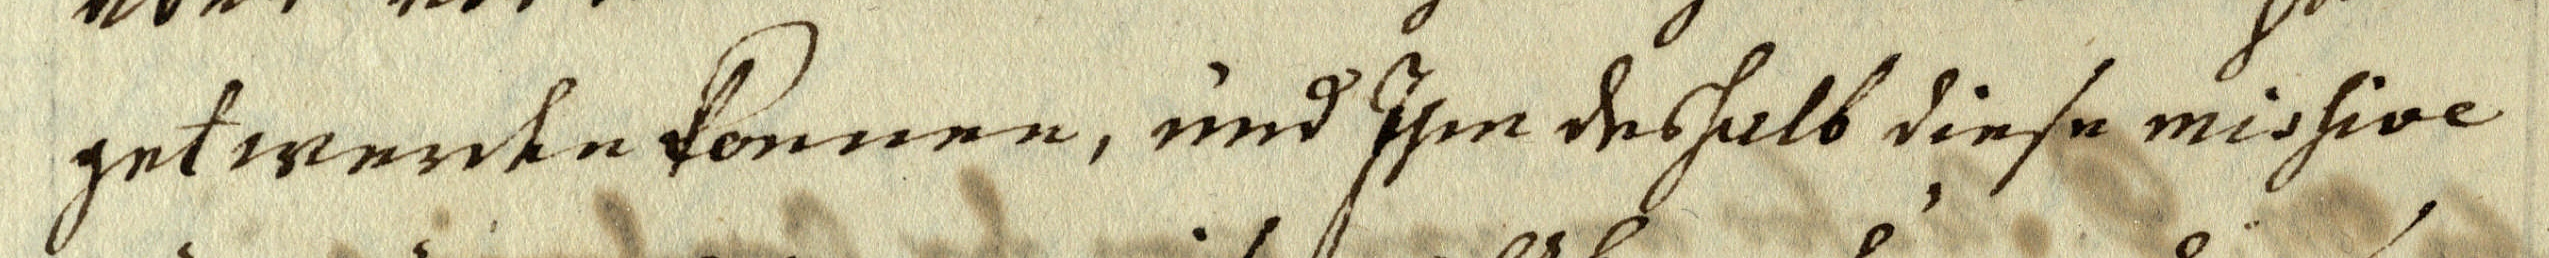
get werden können, und ihm deshalb diese missive
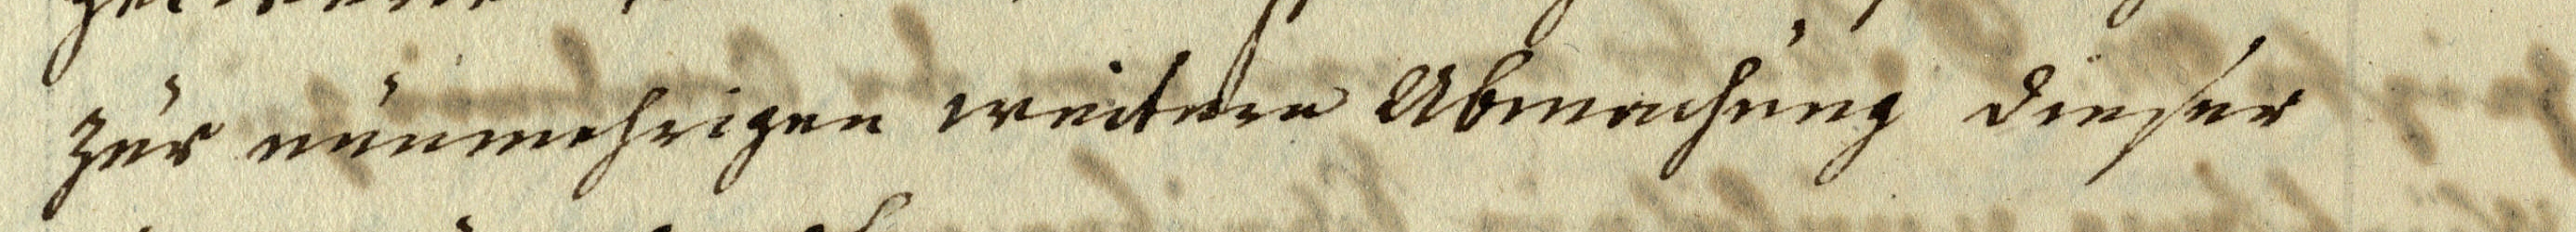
zur nunmehrigen weitern Abmachung dieser
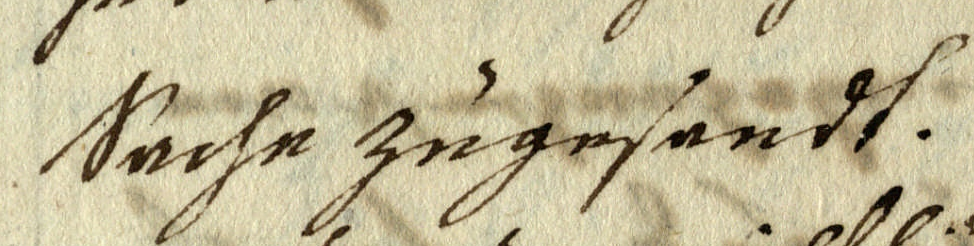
Sache zugesandt.
